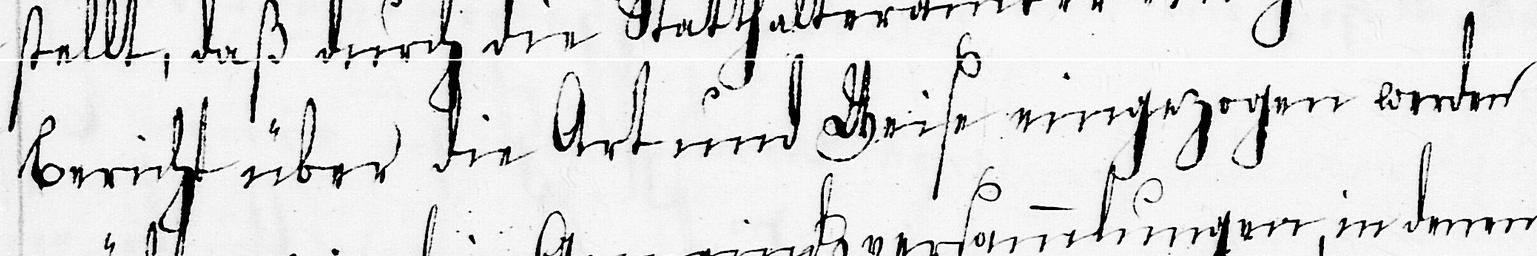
Bericht über die Art und Weise eingezogen werden
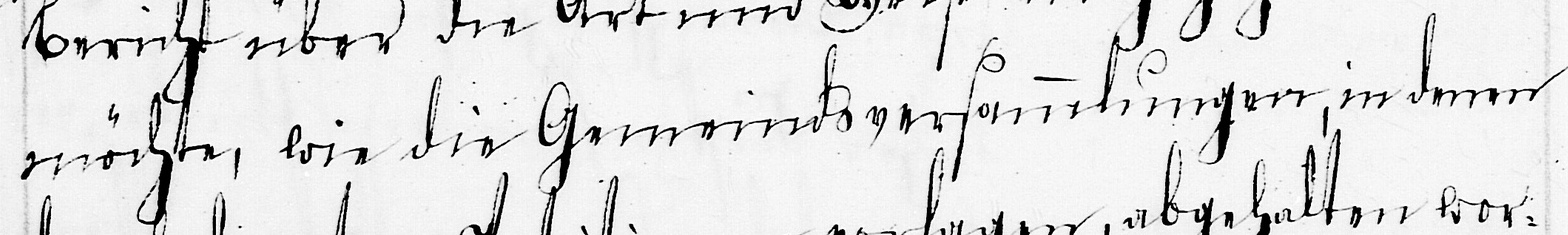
möchte, wie die Gemeindsversammlungen, in denen
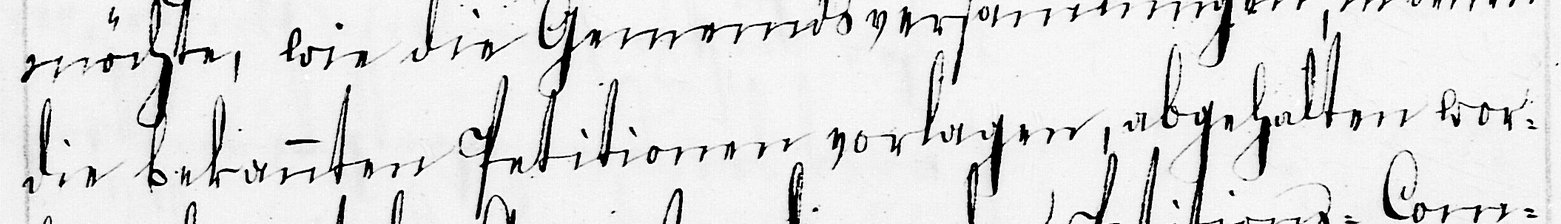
die bekannten Petitionen vorlagen, abgehalten wor¬
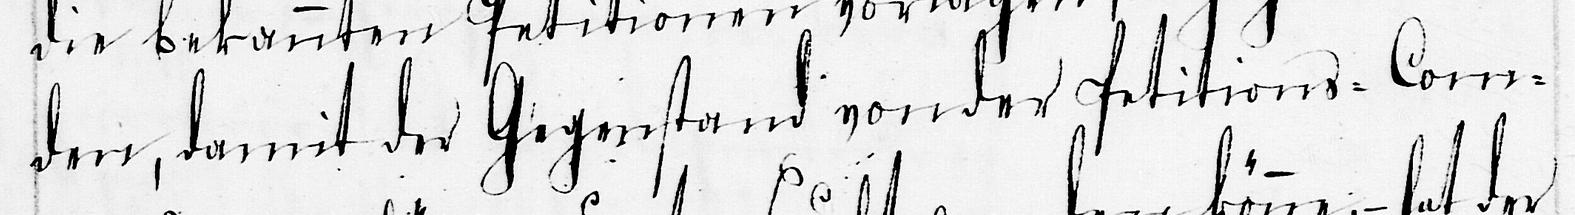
den, damit der Gegenstand von der Petitions-Com¬
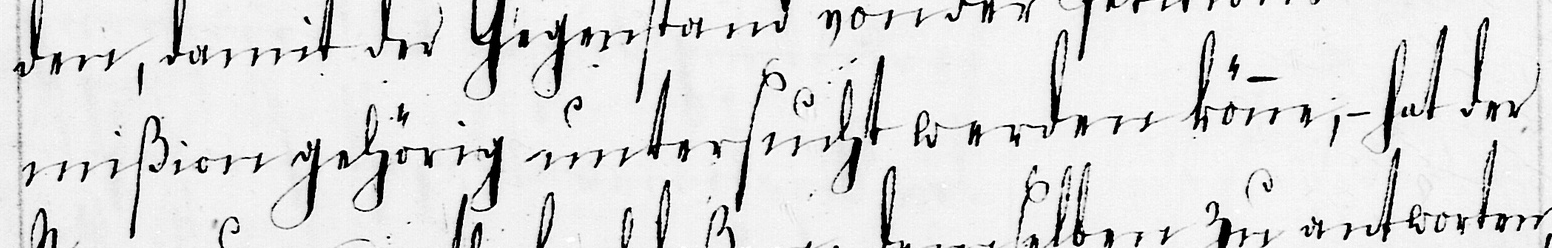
mißion gehörig untersucht werden könne; – hat der
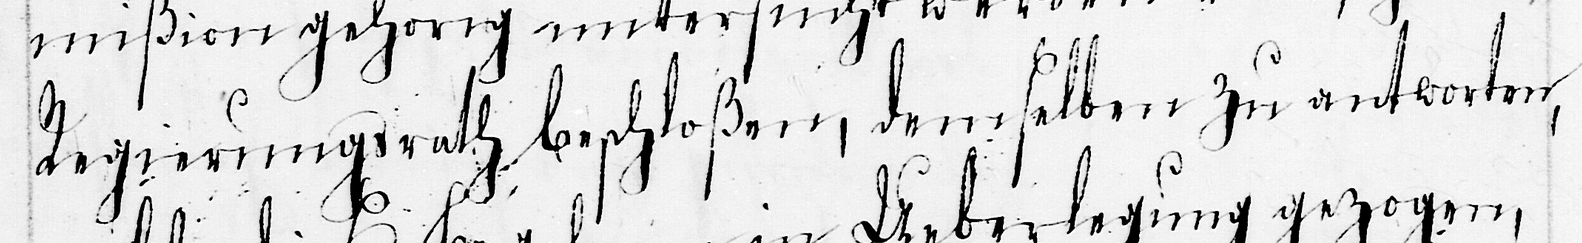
Regierungsrath beschloßen, demselben zu antworten,
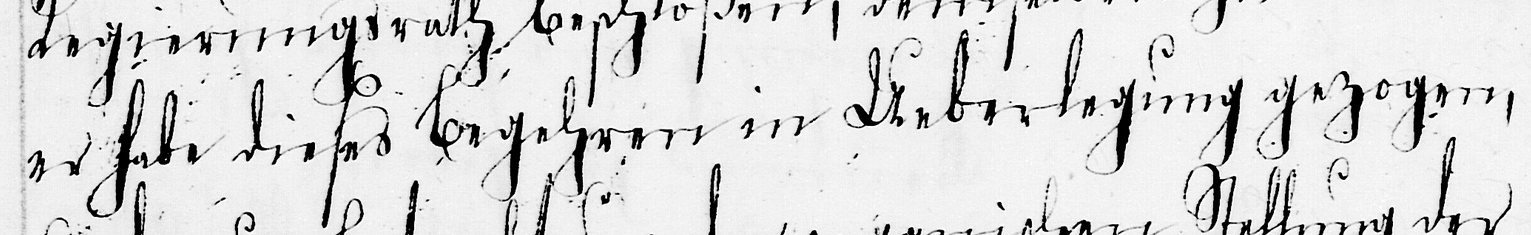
er habe dieses Begehren in Ueberlegung gezogen,
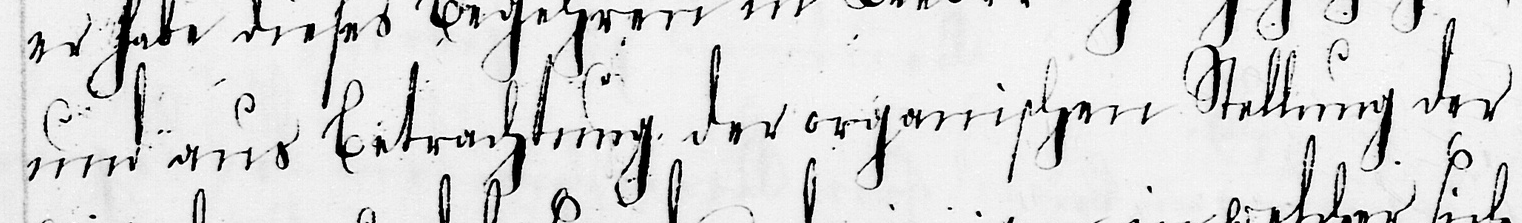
und aus Betrachtung der organischen Stellung der
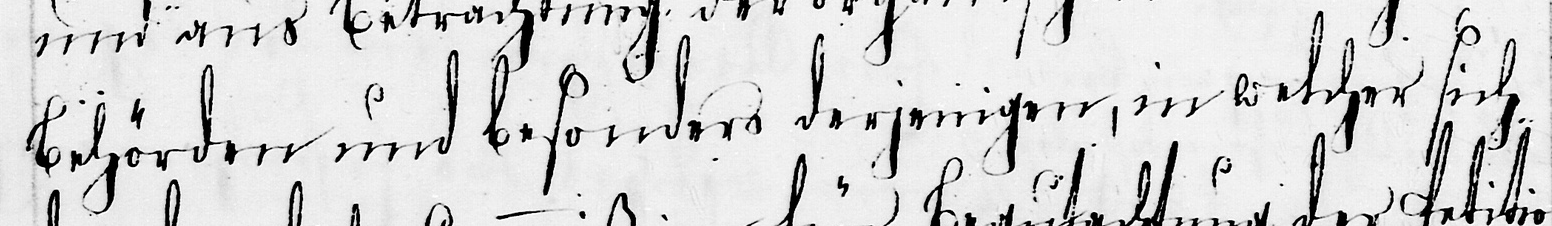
Behörden und besonders derjenigen, in welcher sich
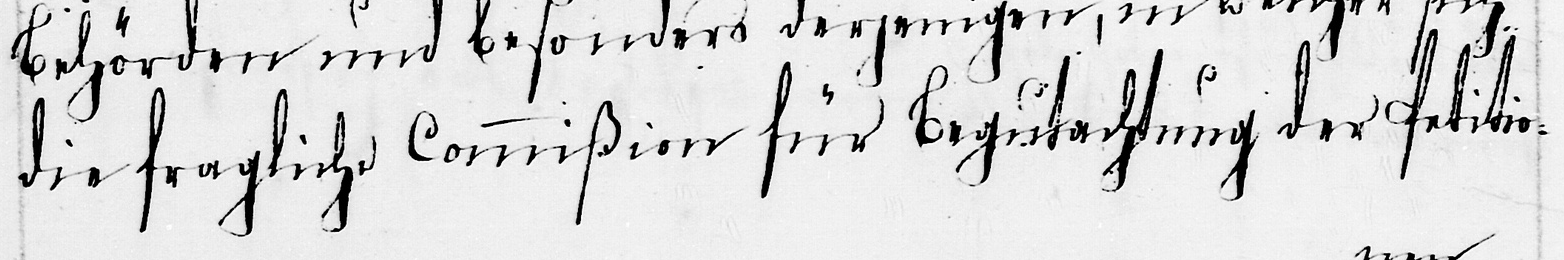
die fragliche Commißion für Begutachtung der Peti¬
